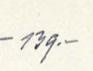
139
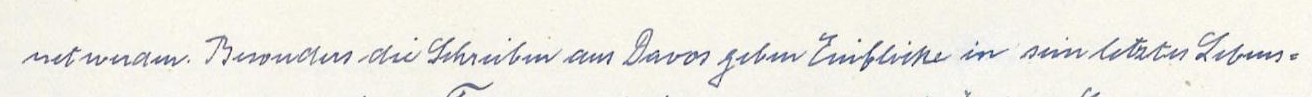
net werden. Besonders die Schreiben aus Davos geben Einblicke in sein letzter Lebens-
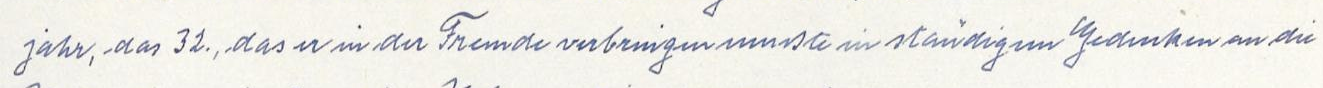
jahr, das 32., das er in der Fremde verbringen mußte in ständigem Gedanken an die
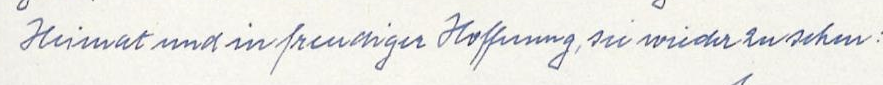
Heimat und in freudiger Hoffnung, sie wiederzusehen:
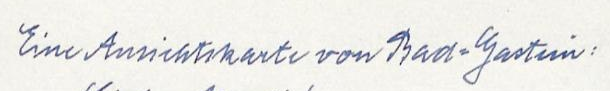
Eine Ansichtkarte von Bad Gastein:
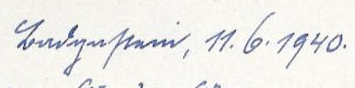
Bad Gastein, 11. 6. 1940
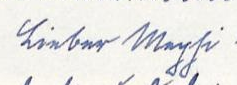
Lieber Mephi!
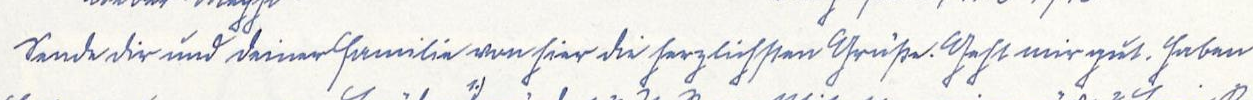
Sende dir und deiner Familie von hier die berzlichsten Grüße. Geht mir gut. Haben
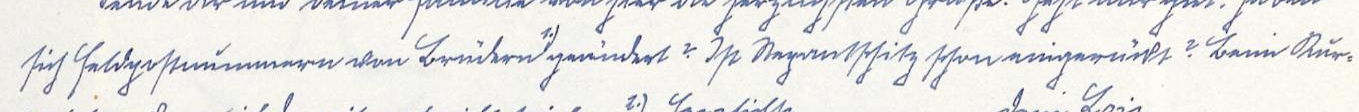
sich Feldpostnummern von Brüdern1) geändert ? Ist Stepantschitz schon eingerückt . Beim Kur-
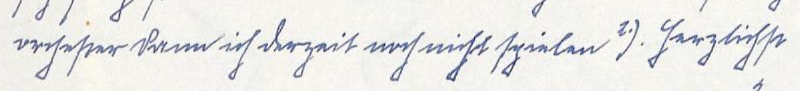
orchester kann ich derzeit noch nicht spielen 2). Herzlichst
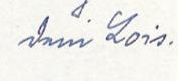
Dein Lois
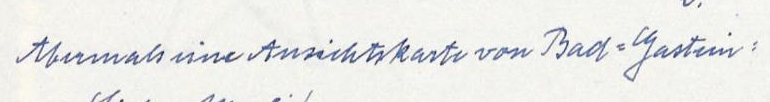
Abermals eine Ansichtskarte von Bad- Gastein:
